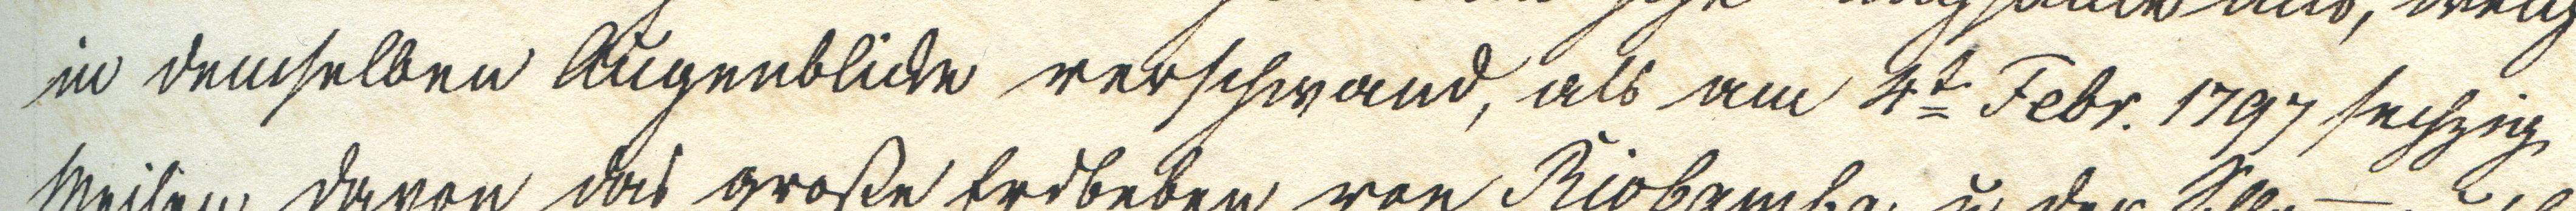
in demselben Augenblick verschwand, als am 4t Febr. 1797 sechzig
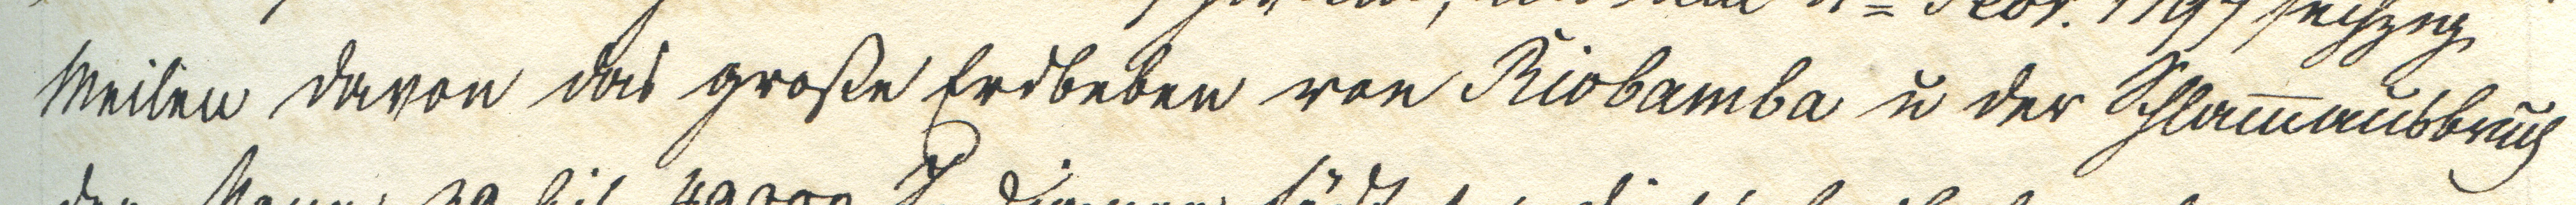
Meilen davon das große Erdbeben von Riobamba u der Schlam̃ausbruch
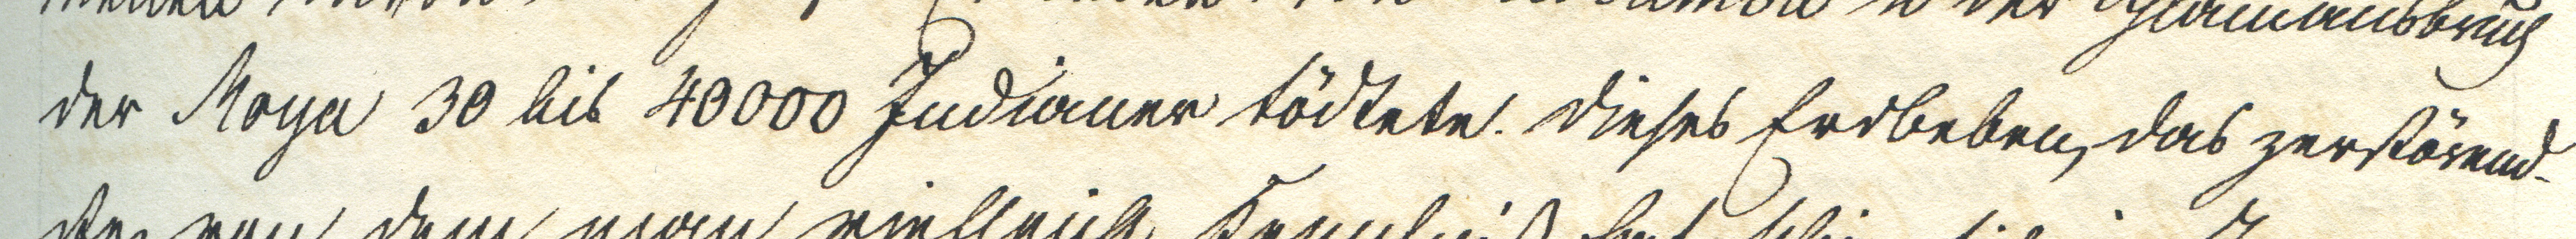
der Moya 30 bis 40000 Indianer tödtete. Dieses Erdbeben, das zerstörend-
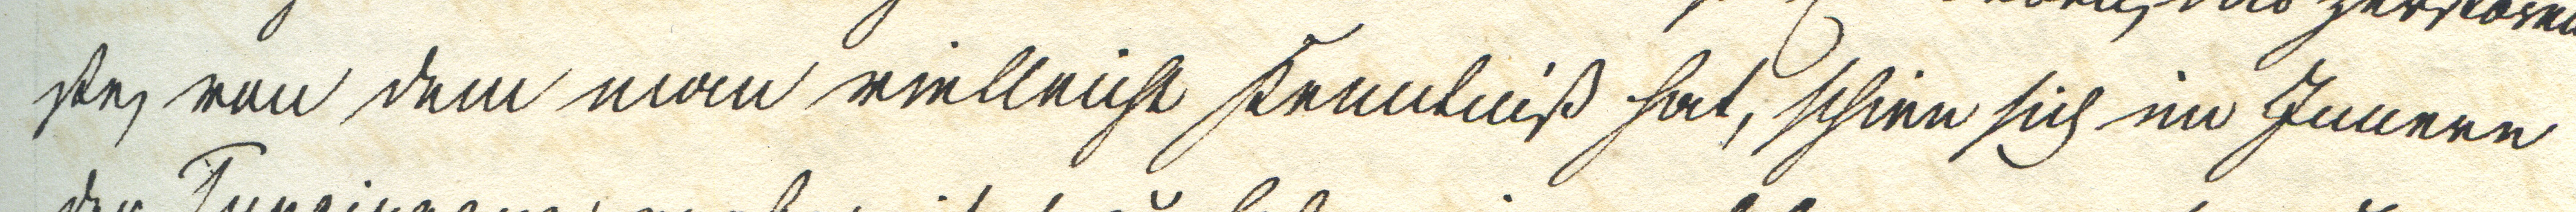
ste von dem man vielleicht Kenntniß hat, schien sich im Innern
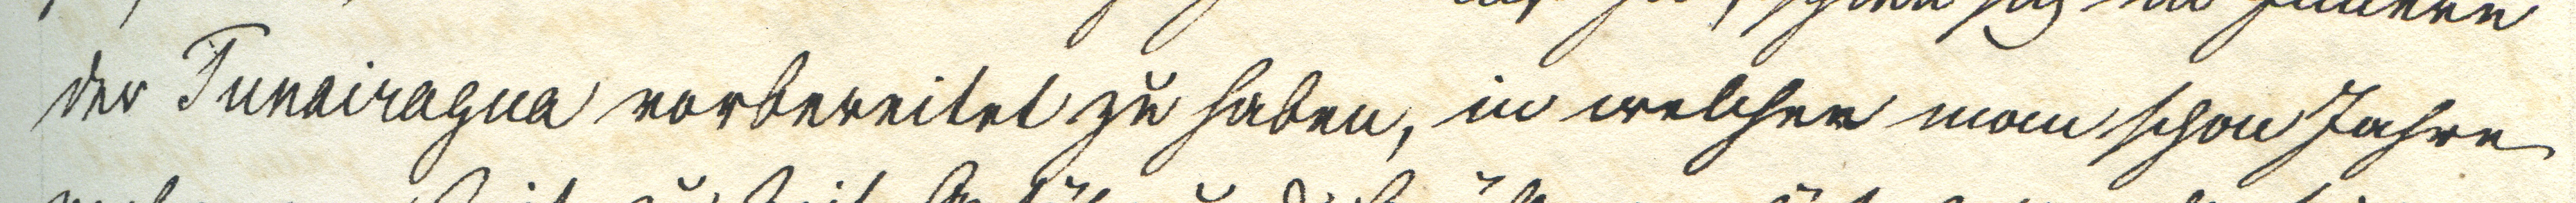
des Tunairagua vorbereitet zu haben, in welchem man schon Jahre
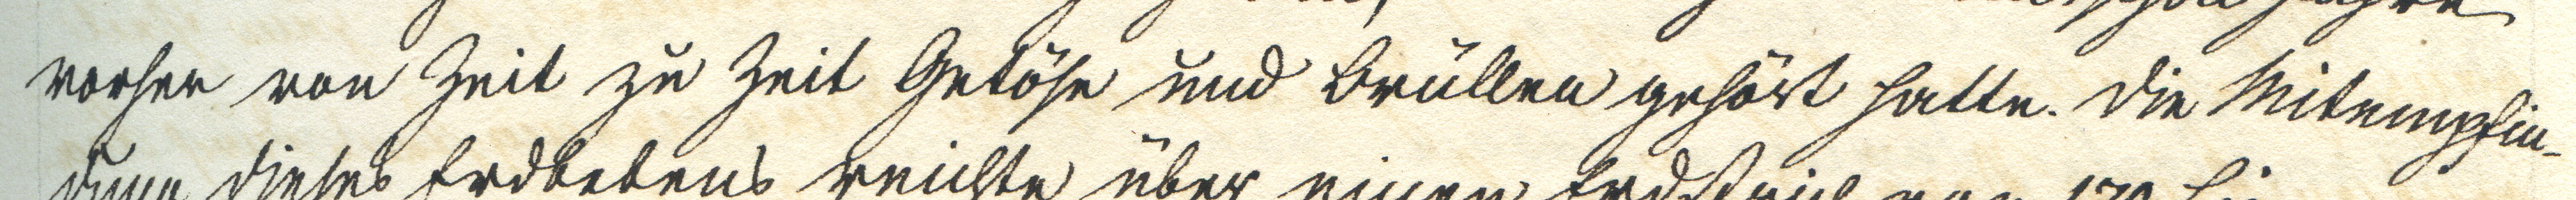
vorher von Zeit zu Zeit Getöse und Brüllen gehört hatte. Die Mitempfin-
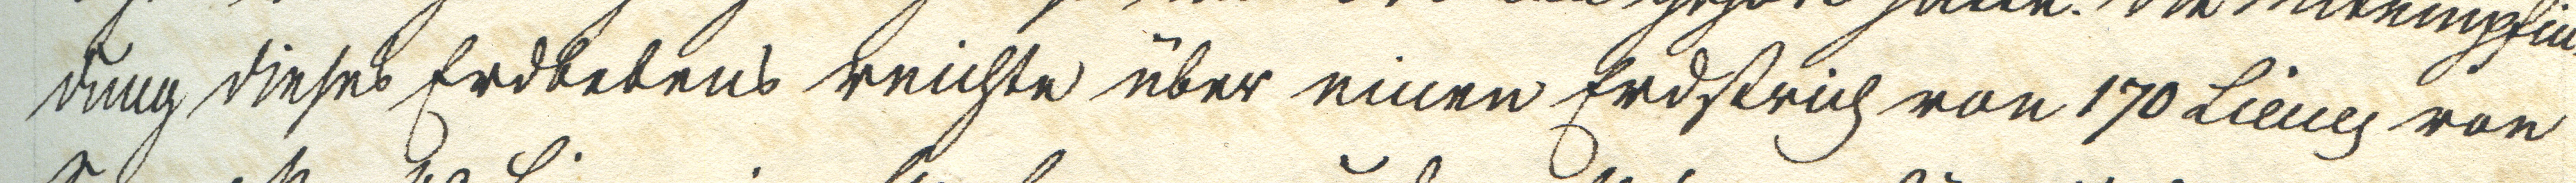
dung dieses Erdbebens reichte über einen Erdstrich von 170 Lieues von
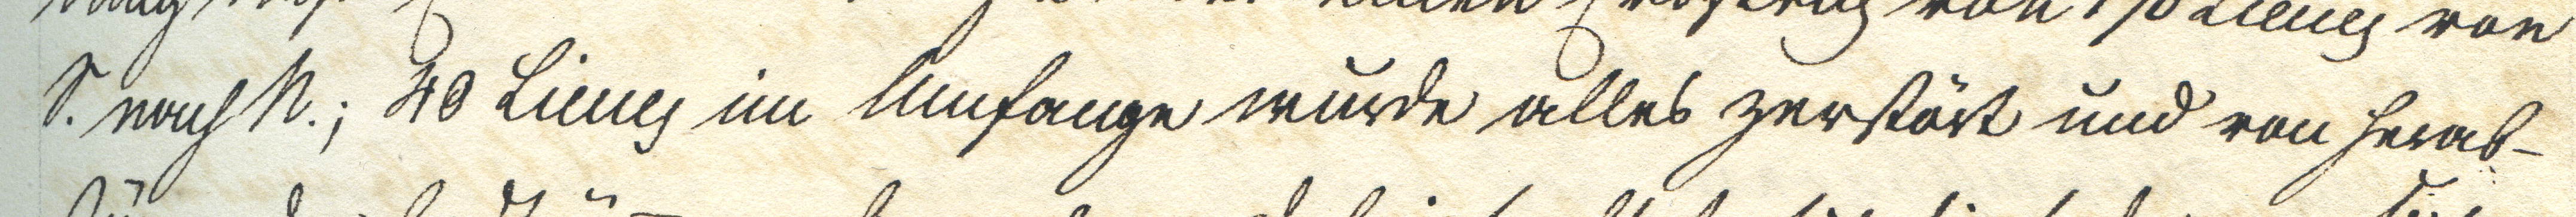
S. nach N., 40 Lieues im Umfange wurde alles zerstört und von herab-
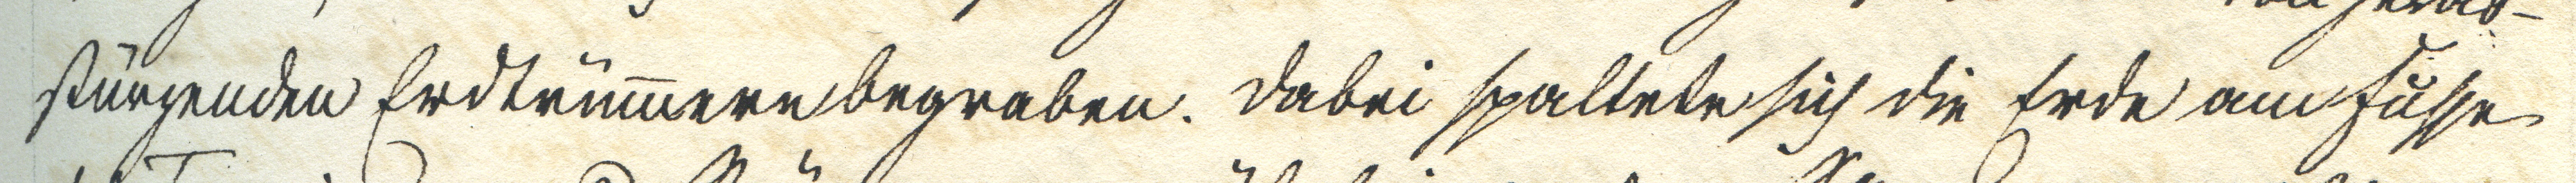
stürzenden Erdtrüm̃ern begraben. Dabei spaltete sich die Erde am Fusse
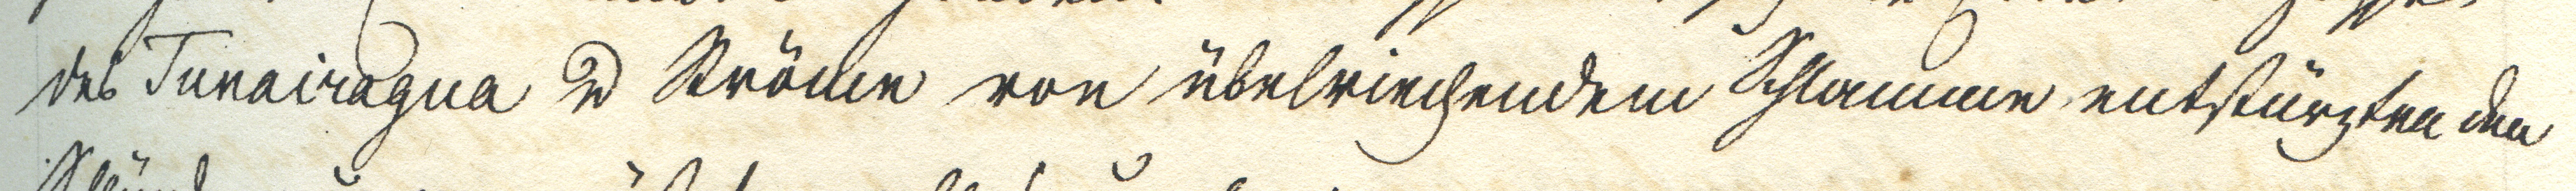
des Tunairagua u Ströme von übelriechendem Schlamme entstürzten den
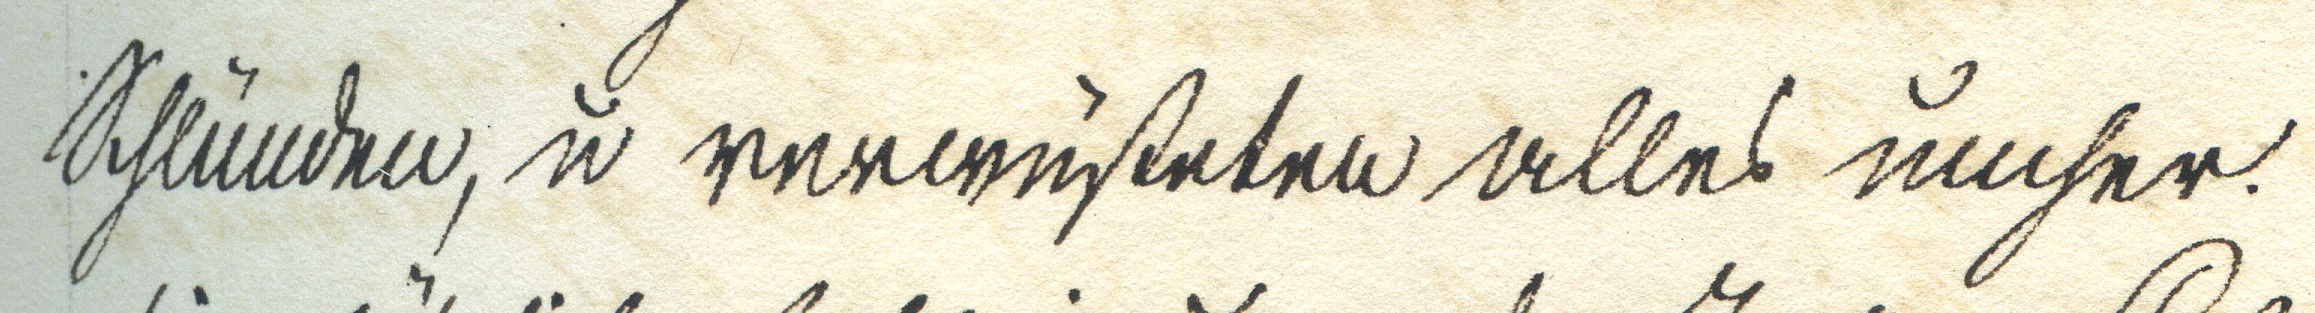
Schlünden, u verwüsteten alles umher.
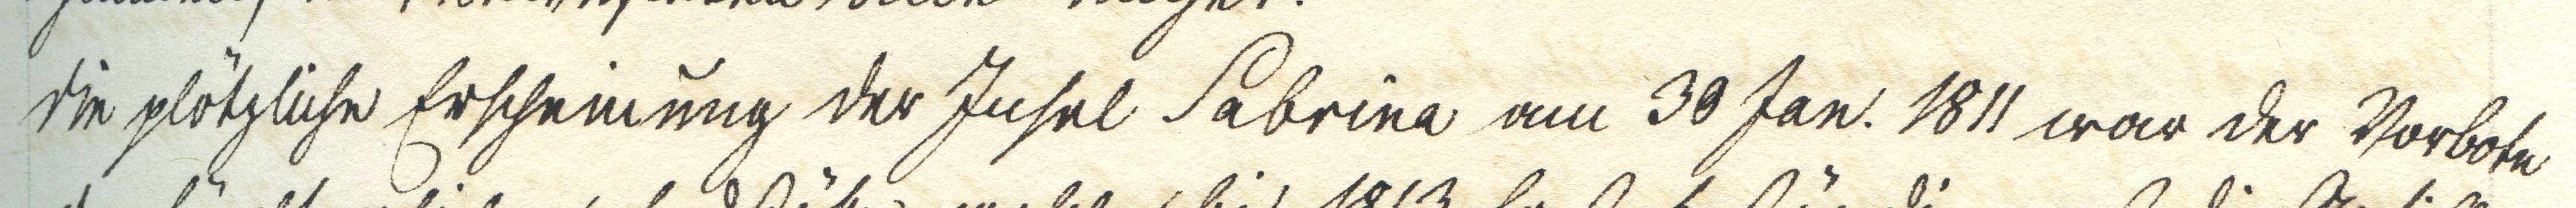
Die plötzliche Erscheinung der Insel Sabrina am 30 Jan. 1811 war der Vorbote
